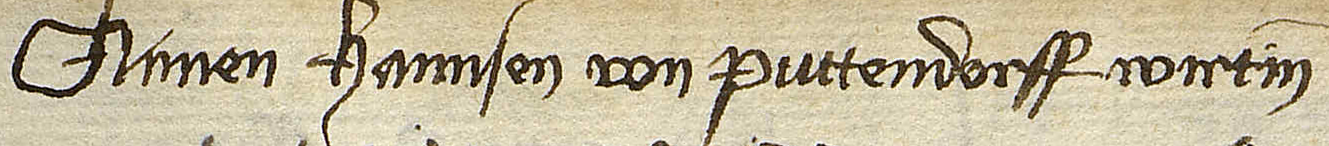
Annen hannſen von Puttendorff wirtin*
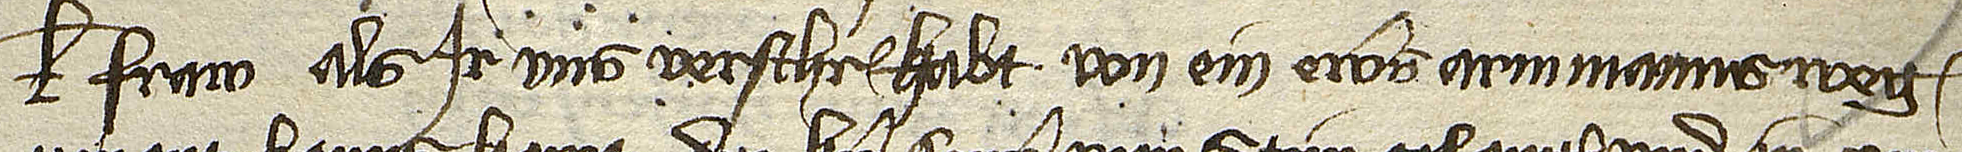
L* fraw als Ir vns verſchr* habt von ein ew*s arm manns weg*
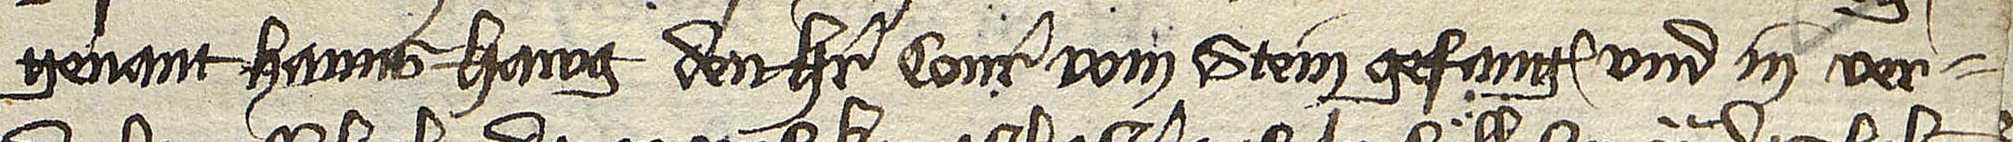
genant hanns hawg den hr* conr* vom Stein gefang* vnd in ver =
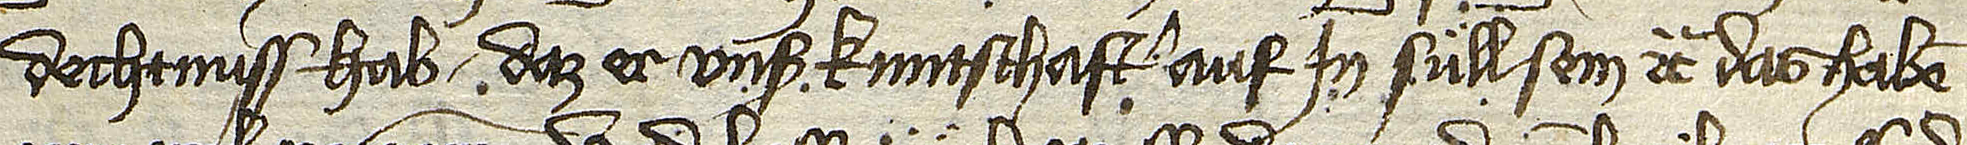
dechtnuſſ hab / daʒ er vnſ* kuntſchaft* auf In ſüll ſein ec* das habe*
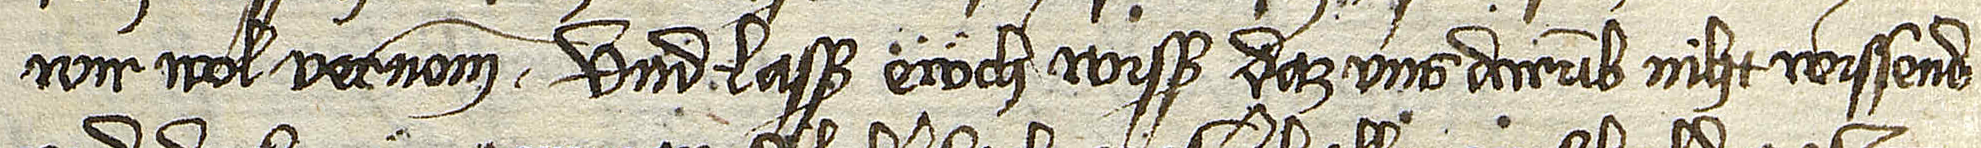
wir wol vernom* / Vnd laſſ* eẅch wiſſ* daʒ vns darub* niht wiſſend
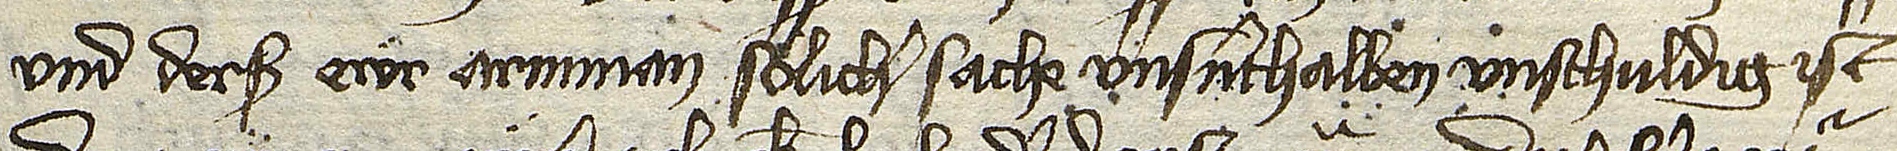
vnd derſ* eẅr armman ſölich* ſache vnſn*thalben vnſchuldig iſt
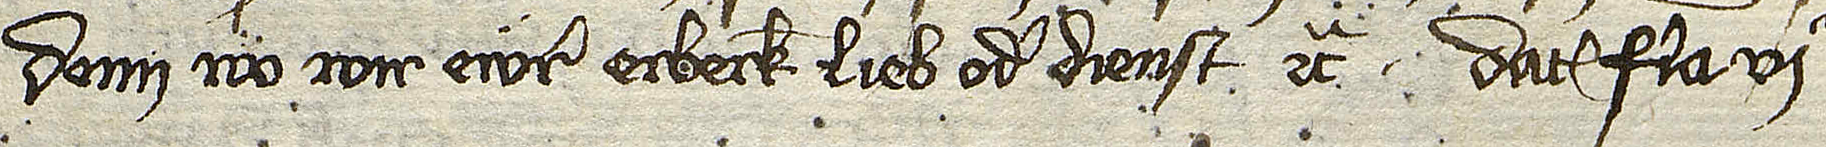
Denn wo wir eẅr* erberk* lieb od* dienſt ec* / Dat* fi*a vi*
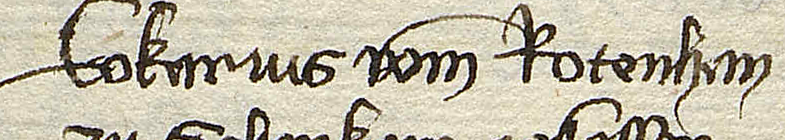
Eokarius vom* Rotenhan
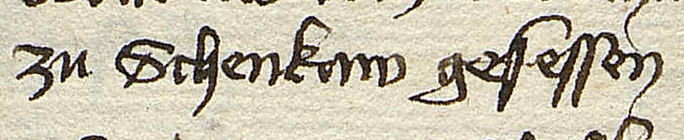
ʒu Schenkaw geſeſſen
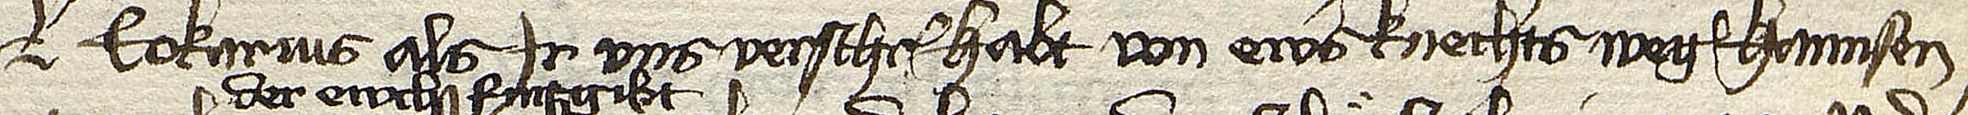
L* Eokarius als Ir vns verſchr* habt von ew*s knecht*s weg* hannſen
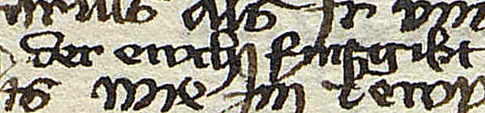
der ewch furgibt
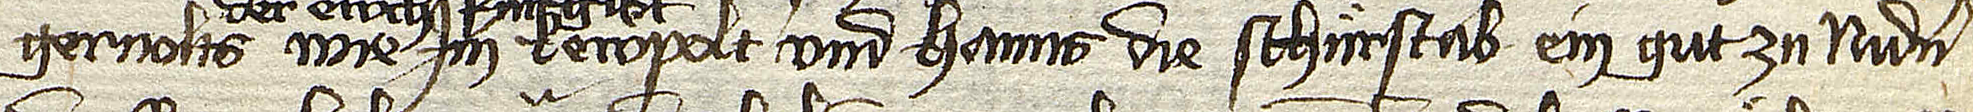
gernolts wie Im lewpolt vnd hanns die ſchürſtab ein gut ʒu Nidn*
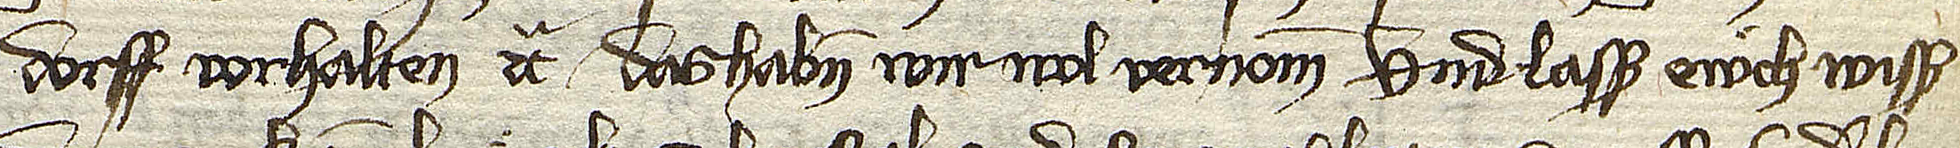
dorff vorhalten ec* / Das habn* wir wol vernom* Vnd laſſ* eẅch wiſſ*
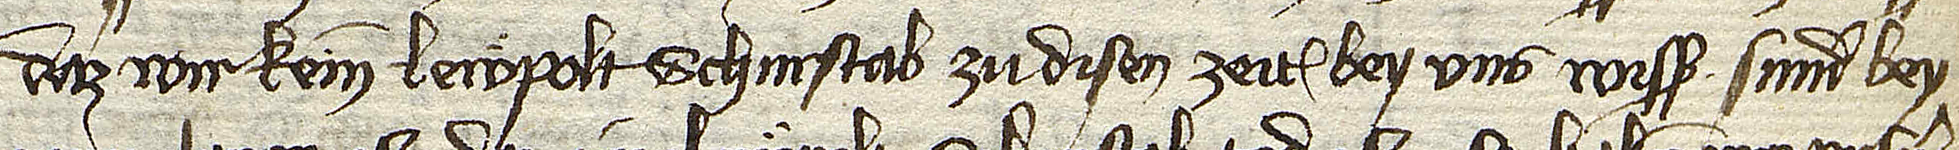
daʒ wir kein* leẅpolt Schurſtab ʒu diſen ʒeit* bey vns wiſſ* . ſund* bey
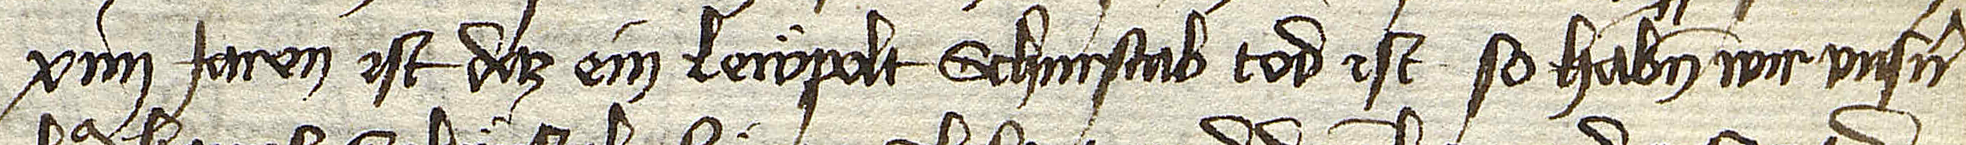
xiiii Iaren iſt daʒ ein leẅpolt Schurſtab tod iſt . ſo habn* wir vnſn*
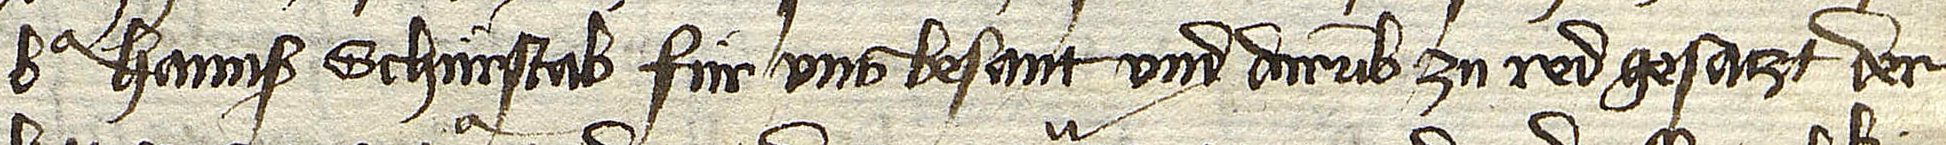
b* hannſ* Schürſtab für vns beſant vnd darub* ʒu red geſacʒt der
